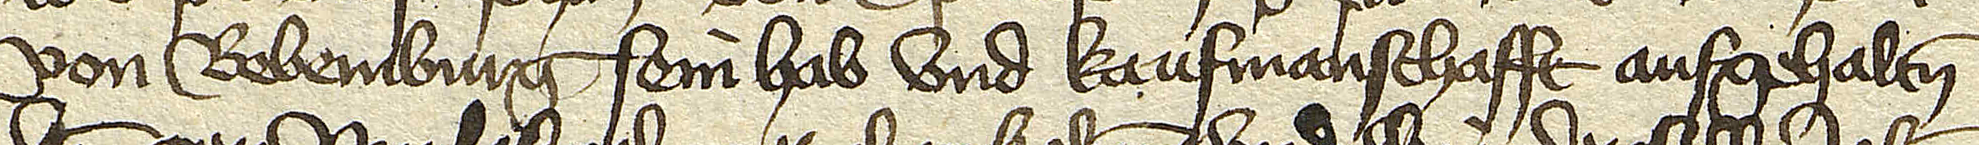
von Bebemburg ſein hab vnd kaufmanſchafft aufgehaltn*
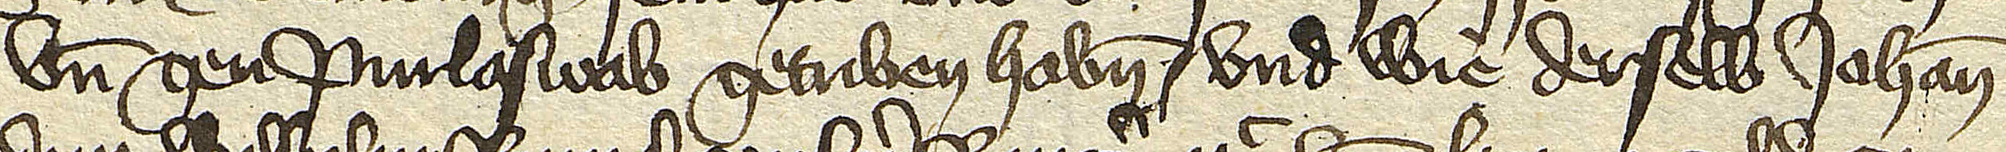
vn* gen Purlaſwab getriben habn* / vnd wie derſelb Iohan*
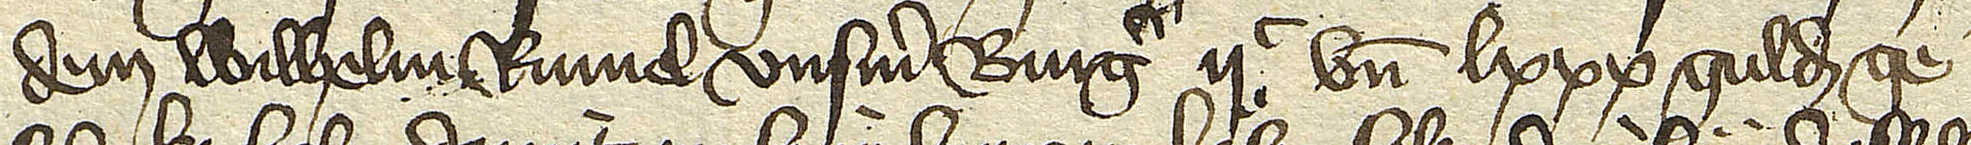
dem wilhelm Rumel vnſm* Burg* ii* vn* lxxx guld* ge
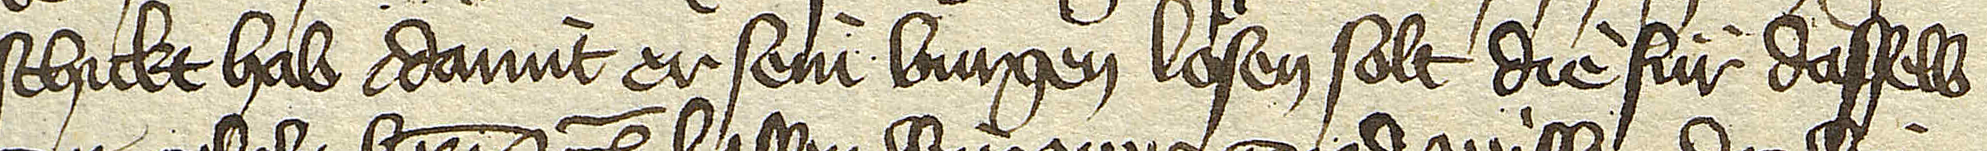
ſchickt hab damit er ſein burger löſen ſolt die für daſſelb
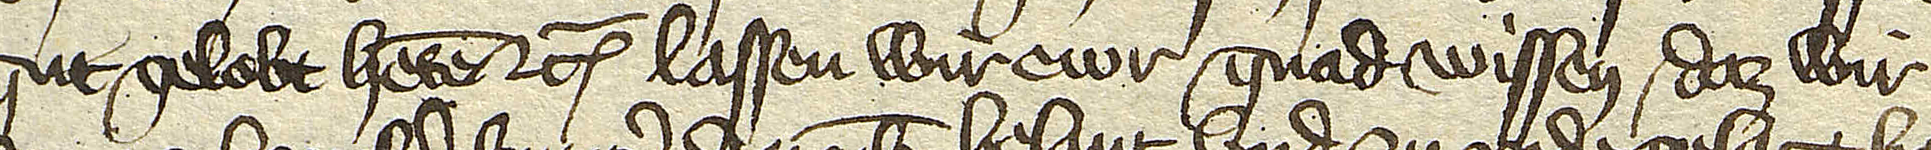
gut gelobt hete* ec* laſſen wir ewr gnad wiſſen / daʒ wir
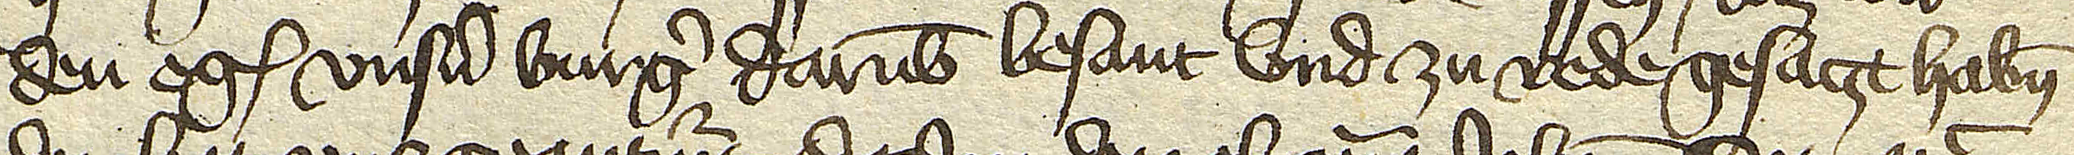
den eg* vnſn* burg* darub* beſant vnd cʒu rede geſacʒt habn*
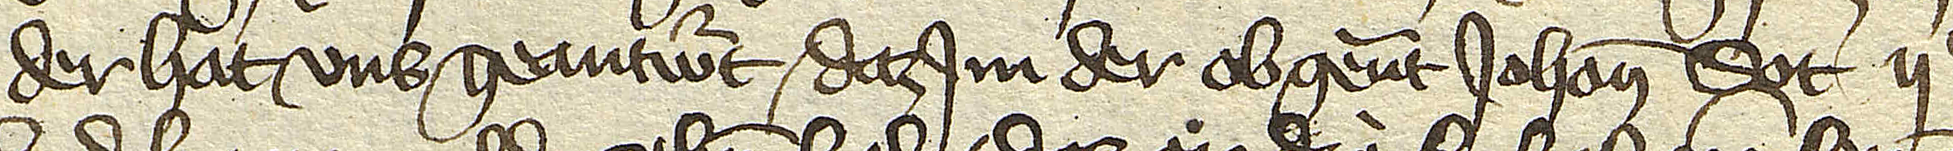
der hat vns geantwt* / daʒ Im der obgent* Iohan* Sot ii*
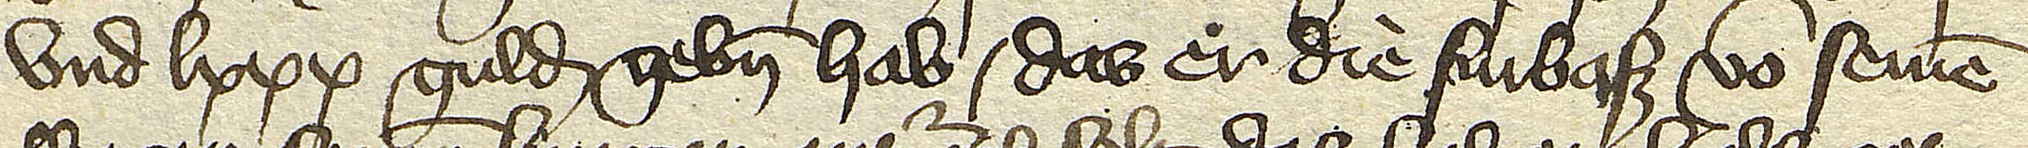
vnd lxxx guld* gebn* hab / das er die fürbaſʒ vo* ſeine*
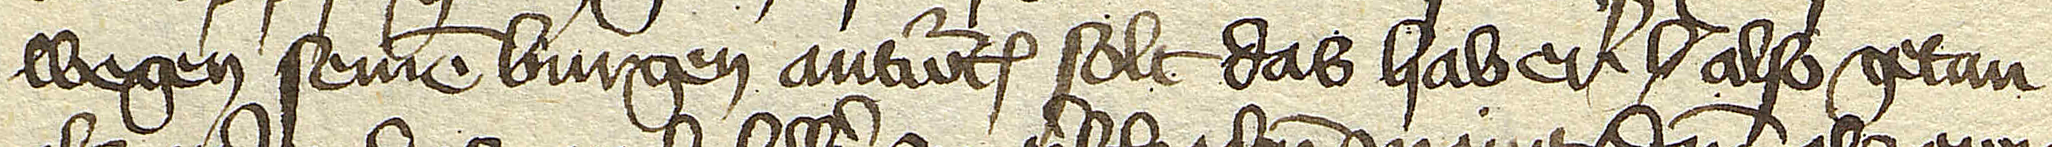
wegen ſeine* burgen antwt* ſolt das hab er / alſo getan
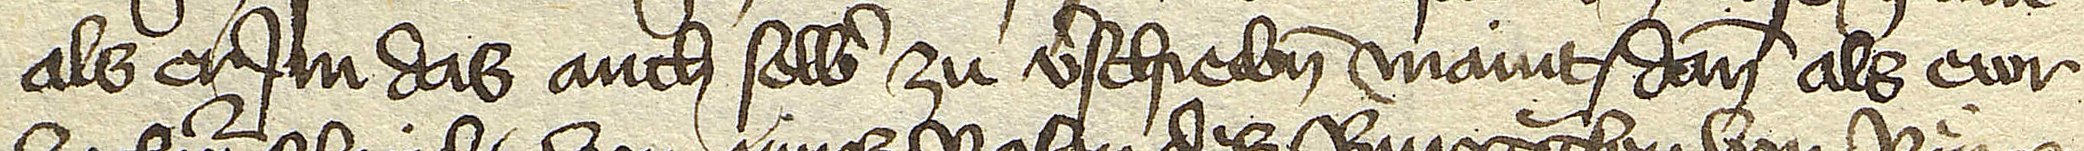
als er Im das auch ſelb* cʒu v*ſchreibn* maint / dan* als ewr
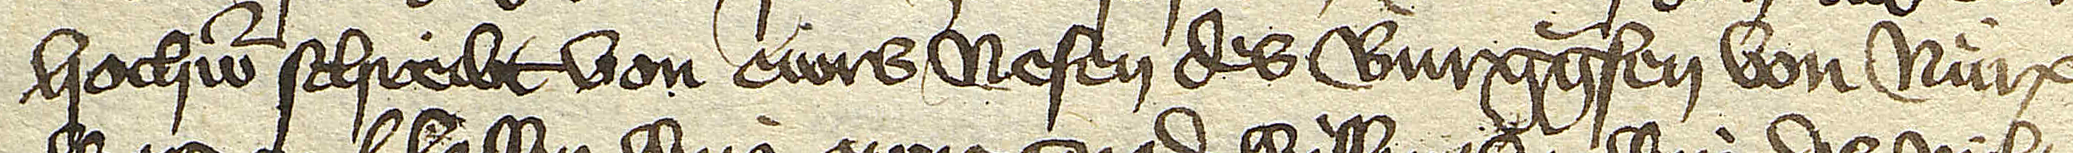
hochw* ſchreibt von ewrs Nefen des Burgg*fen von Nür*
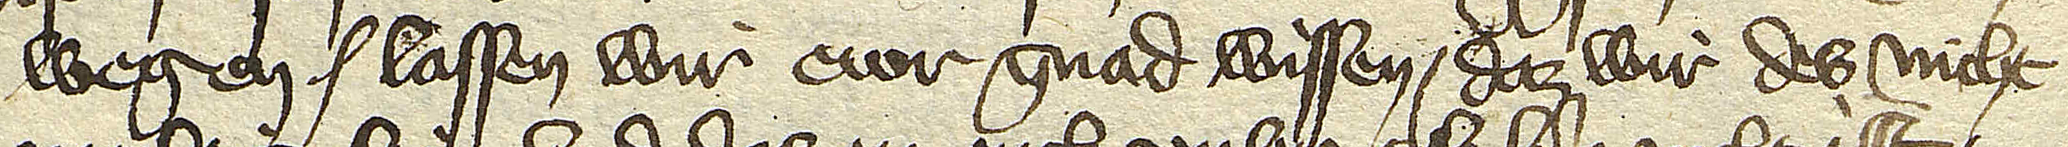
wegen / laſſen wir ewr gnad wiſſen / daʒ wir des nicht
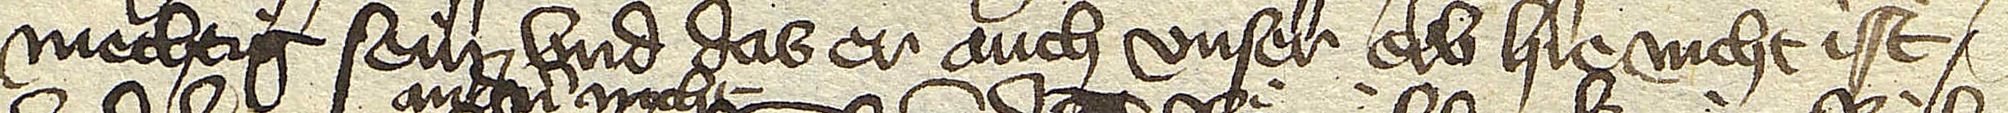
mechtig ſein vnd das er auch vnſer erb h*re nicht iſt /
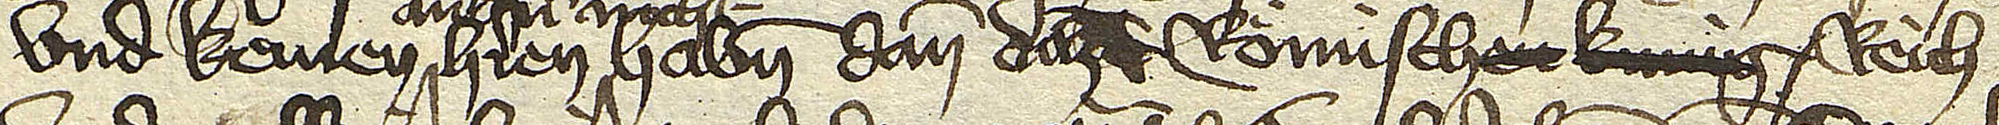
vnd keinen hr*en habn* dan* daʒ S Römiſchen kunig / Reich
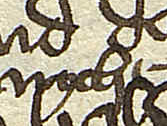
nicht
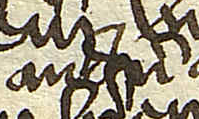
andn*
